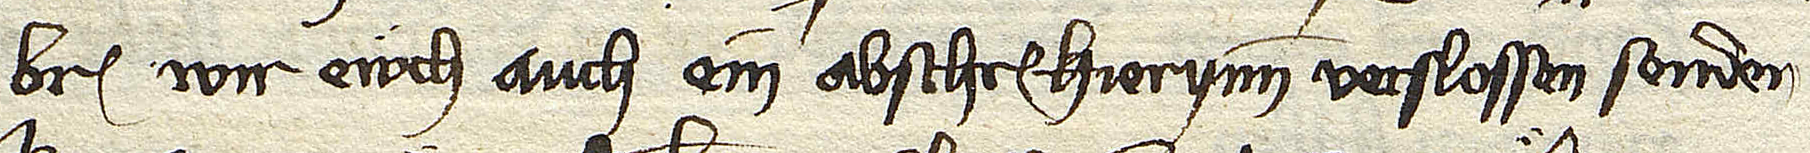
br* wir ewch auch ein abſchr* hierynn* verſloſſen ſenden
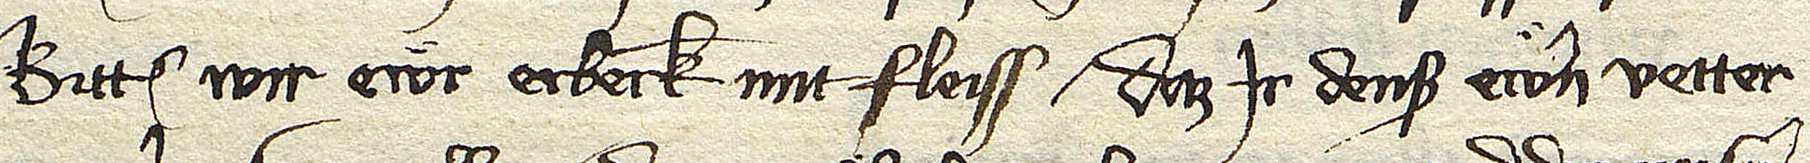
Bitt* wir ewr erberk* mit fleiſſ / Daʒ Ir denſ* ew*n vetter
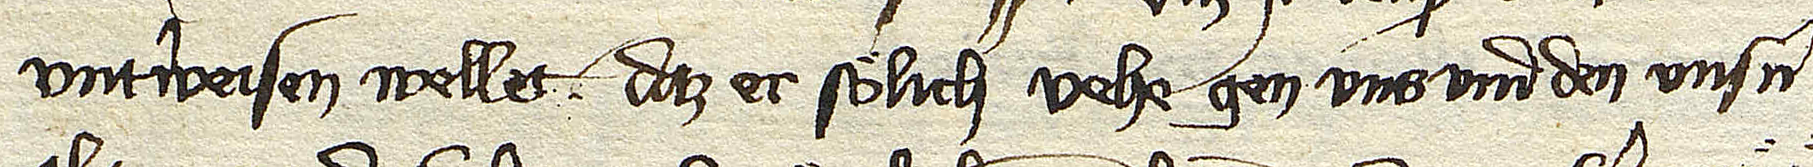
vnt*weiſen wellet / daʒ er ſölich vehe gen vns vnd den vnſ*n
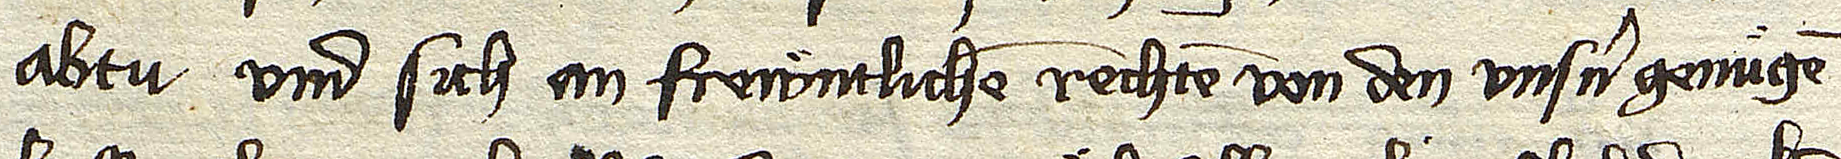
abtu vnd ſich an frewntliche* rechte* von den vnſ*n genüge*
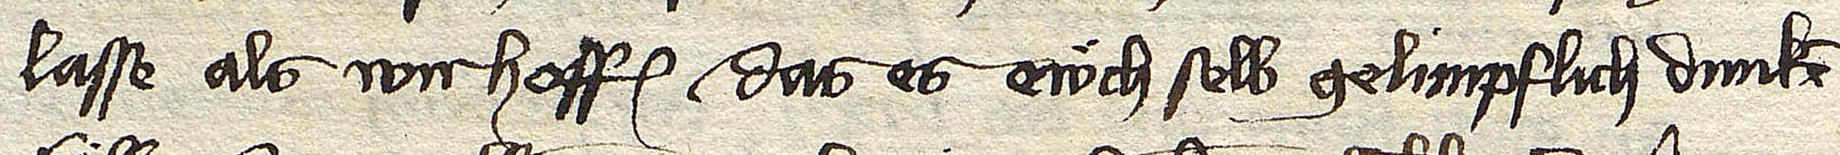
laſſe als wir hoff* / das es ewch ſelb gelimpflich dunke*
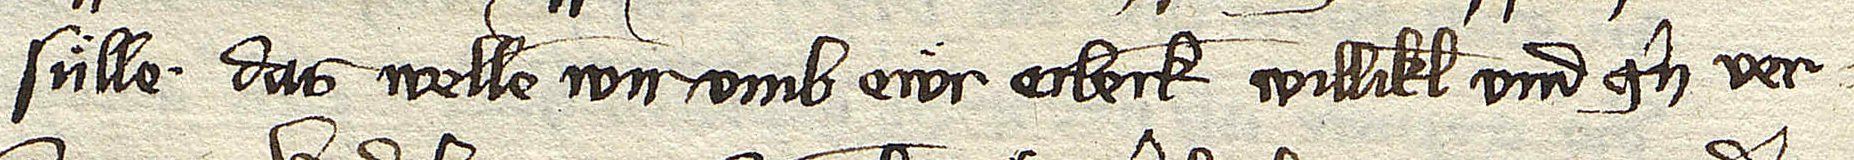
ſülle . das welle* wir vmb ewr erberk* willikl* vnd g*n ver =
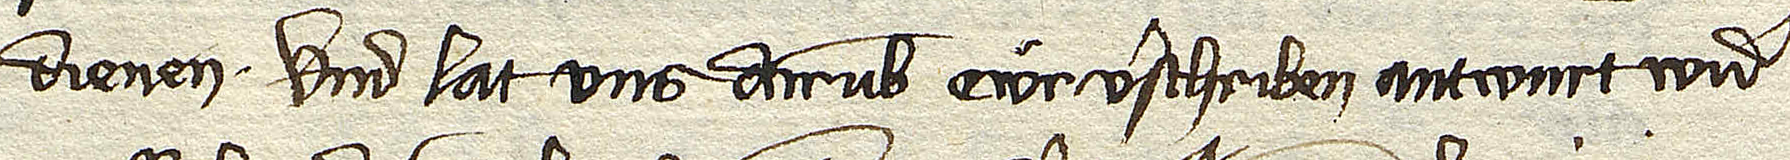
dienen . Vnd lat vns daru*b ewr v*ſchriben antwurt wid*
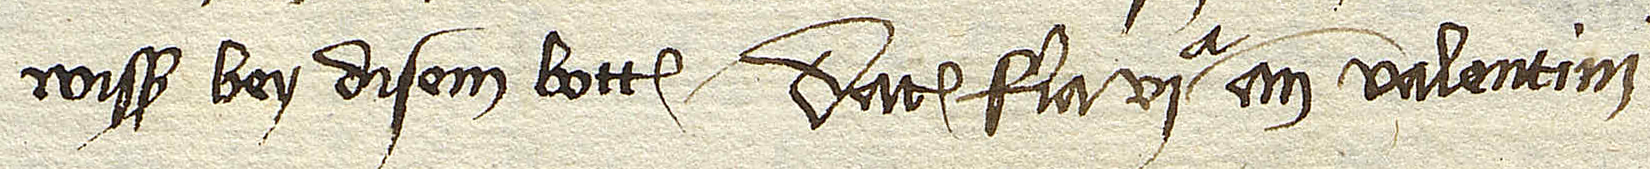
wiſſ* bey diſem bott* / Dat* fia* vi* an* valentini
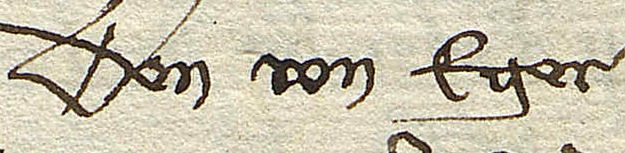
Den von Eger
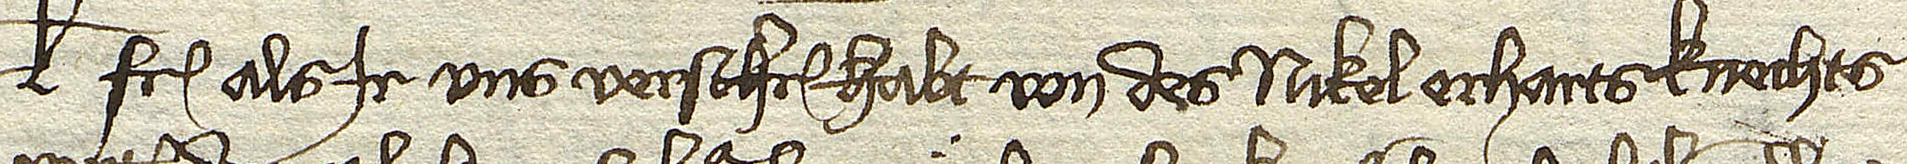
L* fr* als Ir vns verſchr* habt von des Nikel erharts knechts
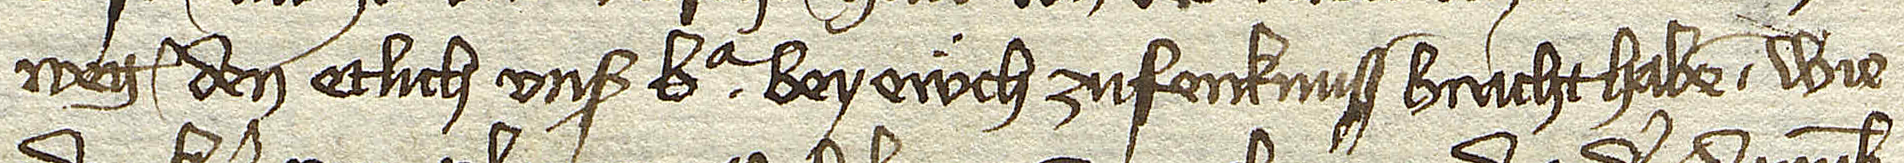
weg* den etlich vnſ* b* . bey ewch ʒu fenknuſſ bracht habe* / wie
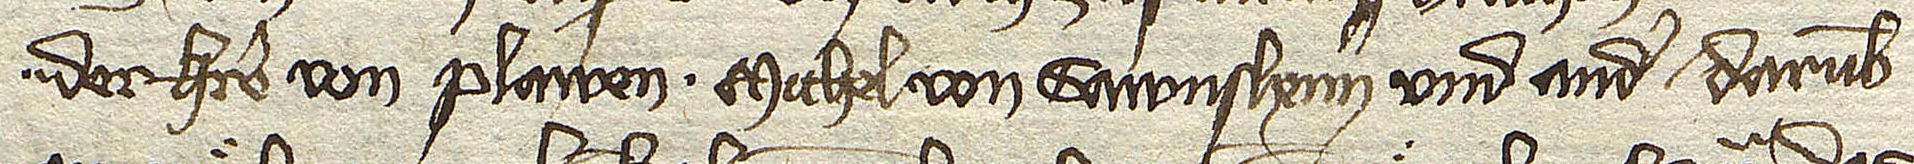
~ der H*re von plawen . Michel von Sawnſheim vnd and* / daru*b
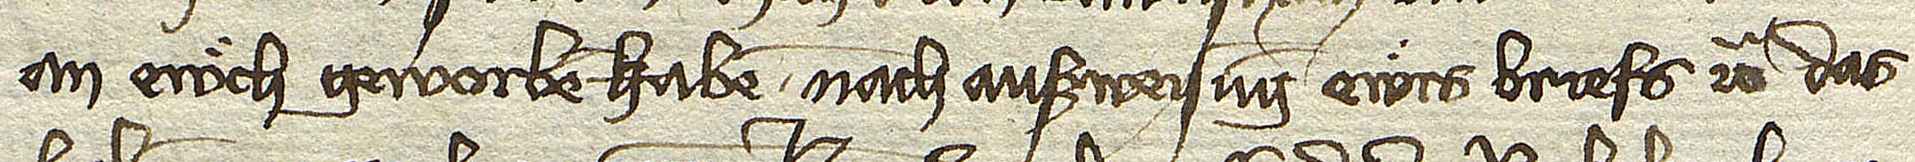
an ewch geworbe* habe* . nach auſʒweiſu*g ewrs briefs ec* das
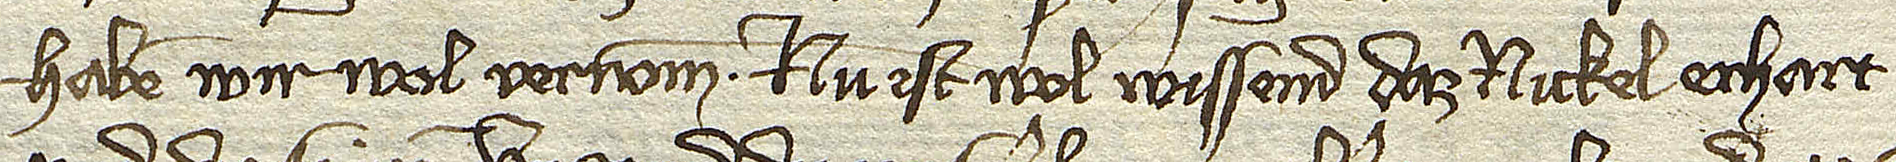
habe* wir wol vernom* . Nu iſt wol wiſſend daʒ Nikel erhart
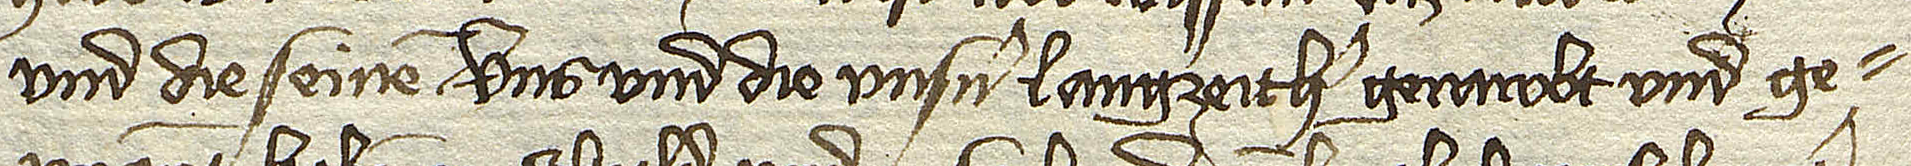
vnd die ſeine* / Vns vnd die vnſ*n langʒeit h* gerawbt vnd ge =
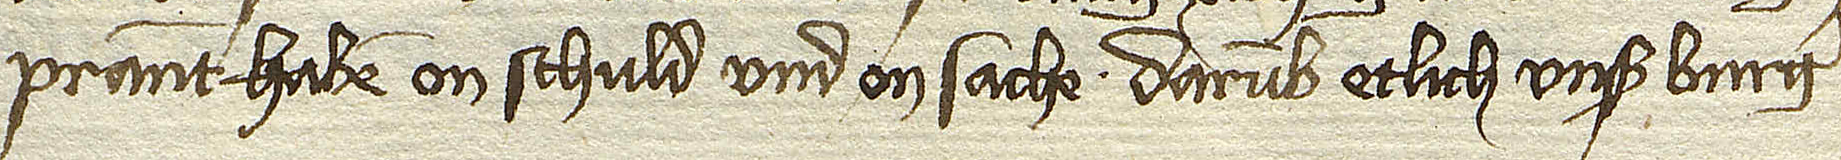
pran*t habe* on ſchuld vnd on ſache . daru*b etlich vnſ* burg*
